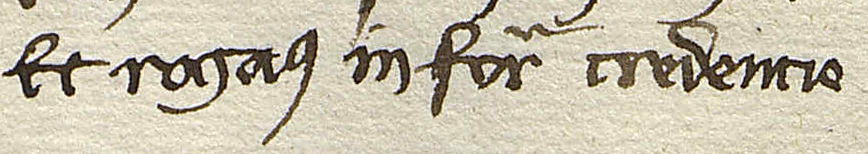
Et roga* in for* credencie
